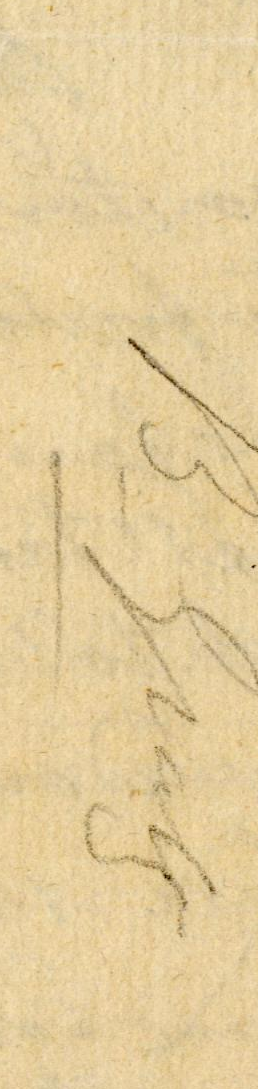B Gratz
